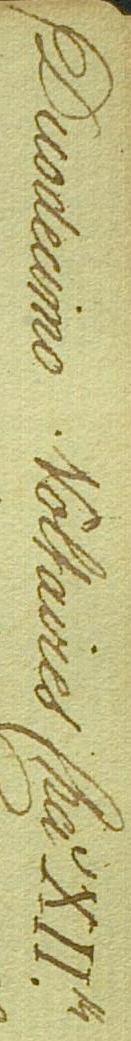Duodecimo Voltaires Cha^r XII^th.
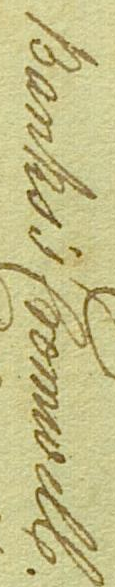Banks's Cromwell.
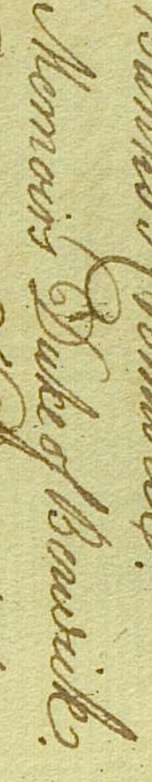Memoirs Duke of Berwick.
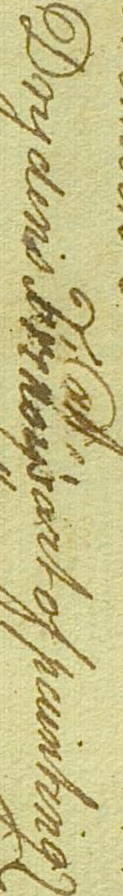Dryden's Fresnoy's art of painting
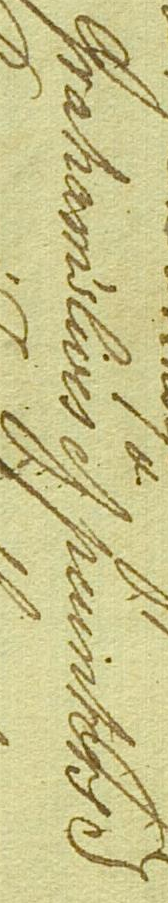Graham's lives of painters
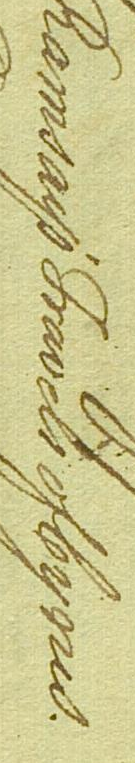Ramsay's Travels of Cyrus.
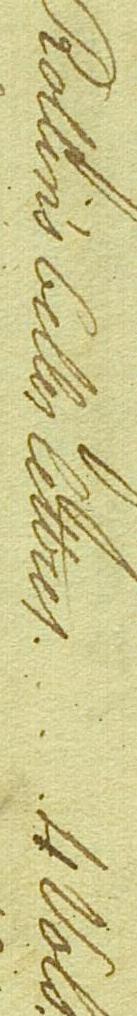Rollin's belles lettres . . . . 4 Vols.
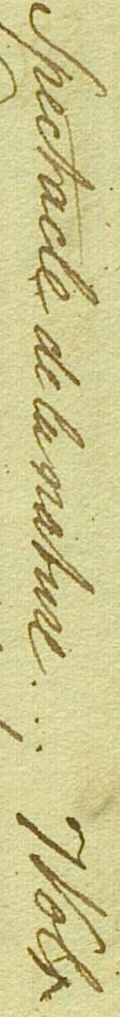Spectacle de la nature . . . 7 Vols
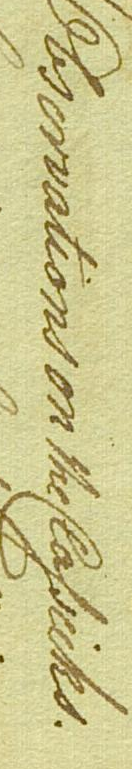Observations on the Classicks.
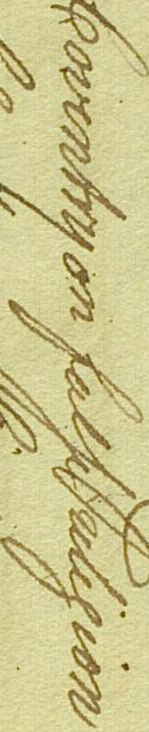Coventry on false religion
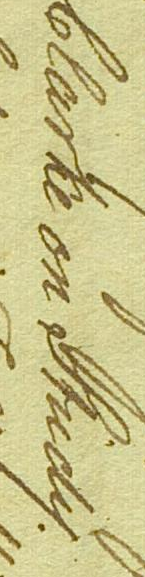Clarke on Study.
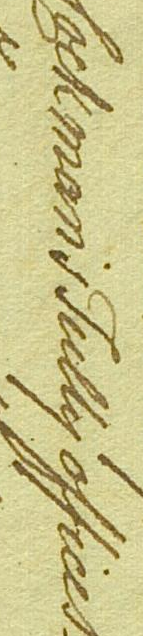Cockman's Tully offices.
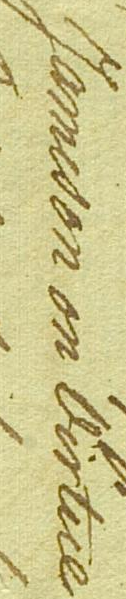Jameson on Virtue
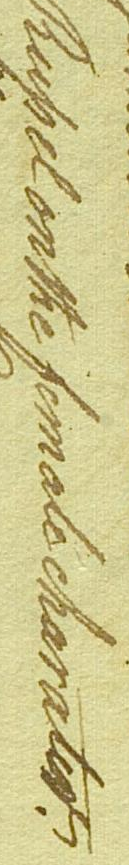Rupel on the female character.
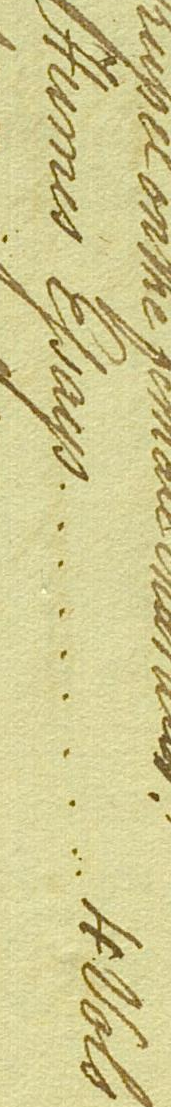Humes Essays . . . . . . . . 4 Vols
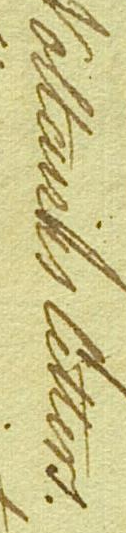Voltaires letters.
